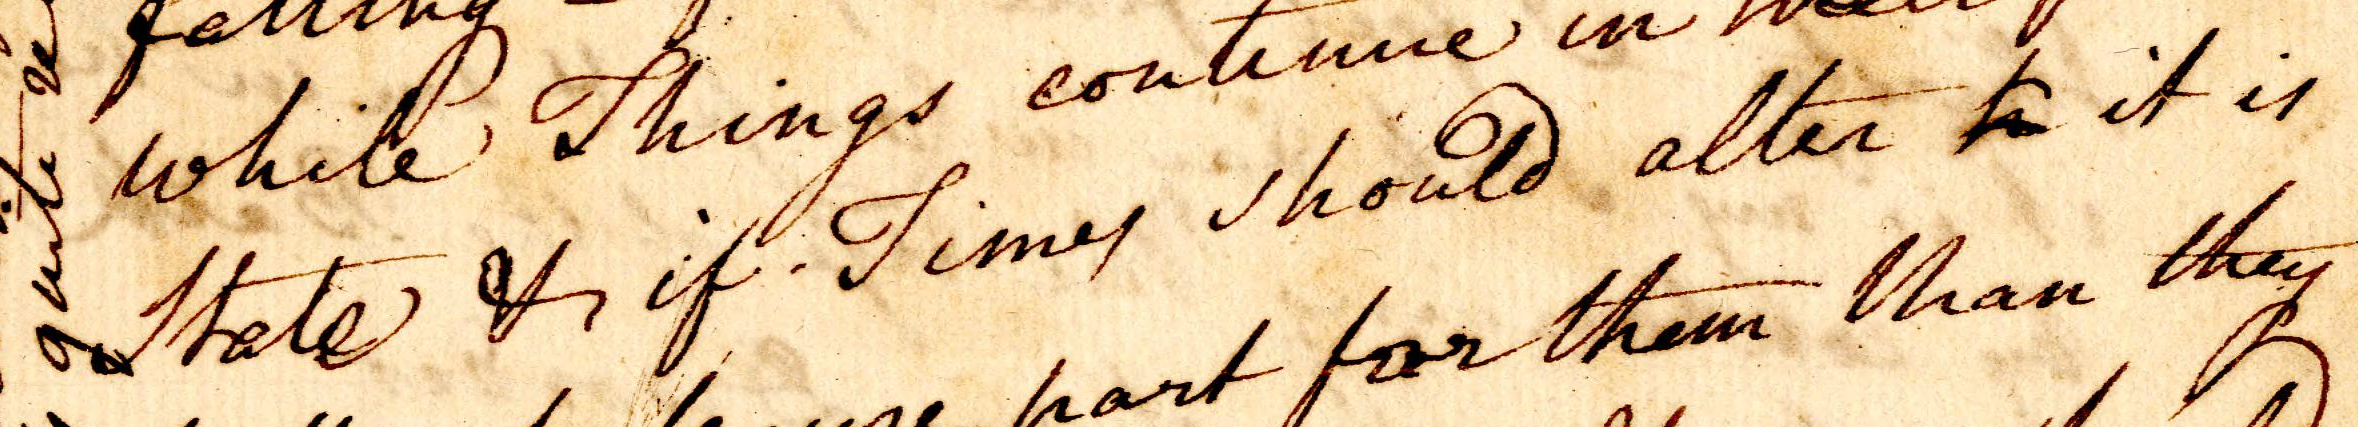State & if Times should alter to it is
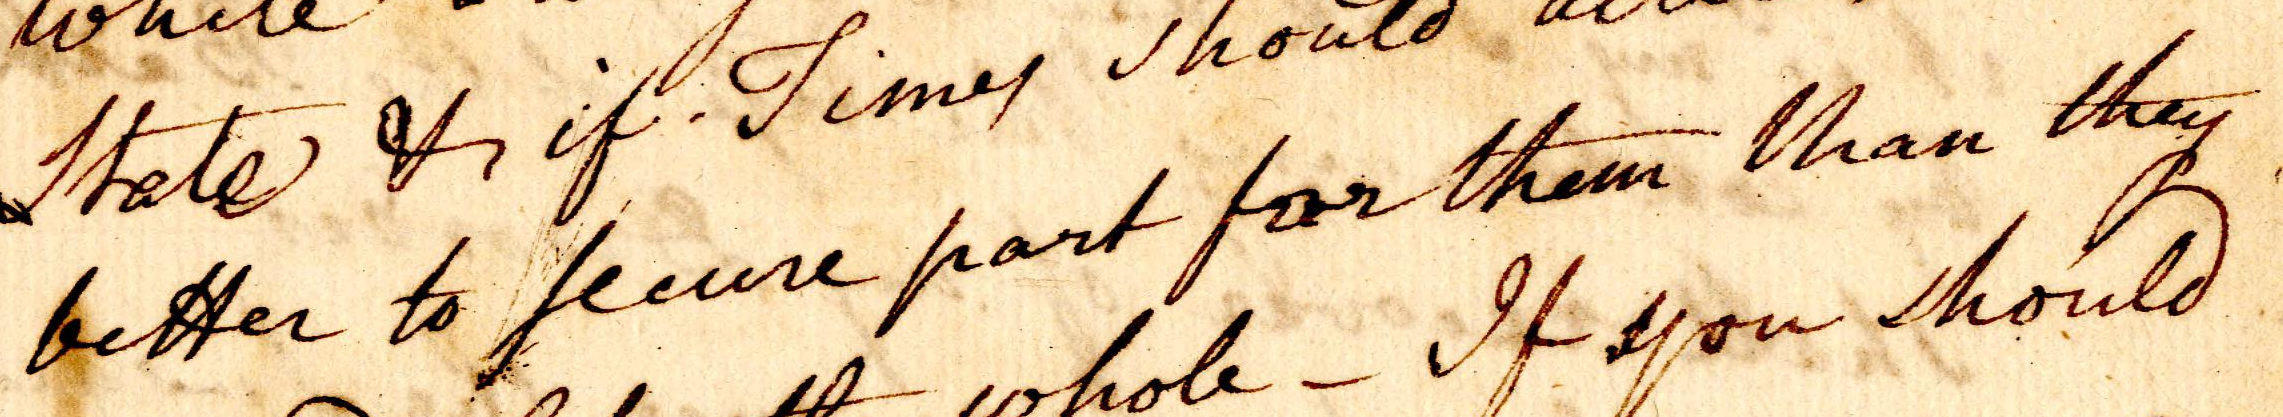better to secure part for them than they
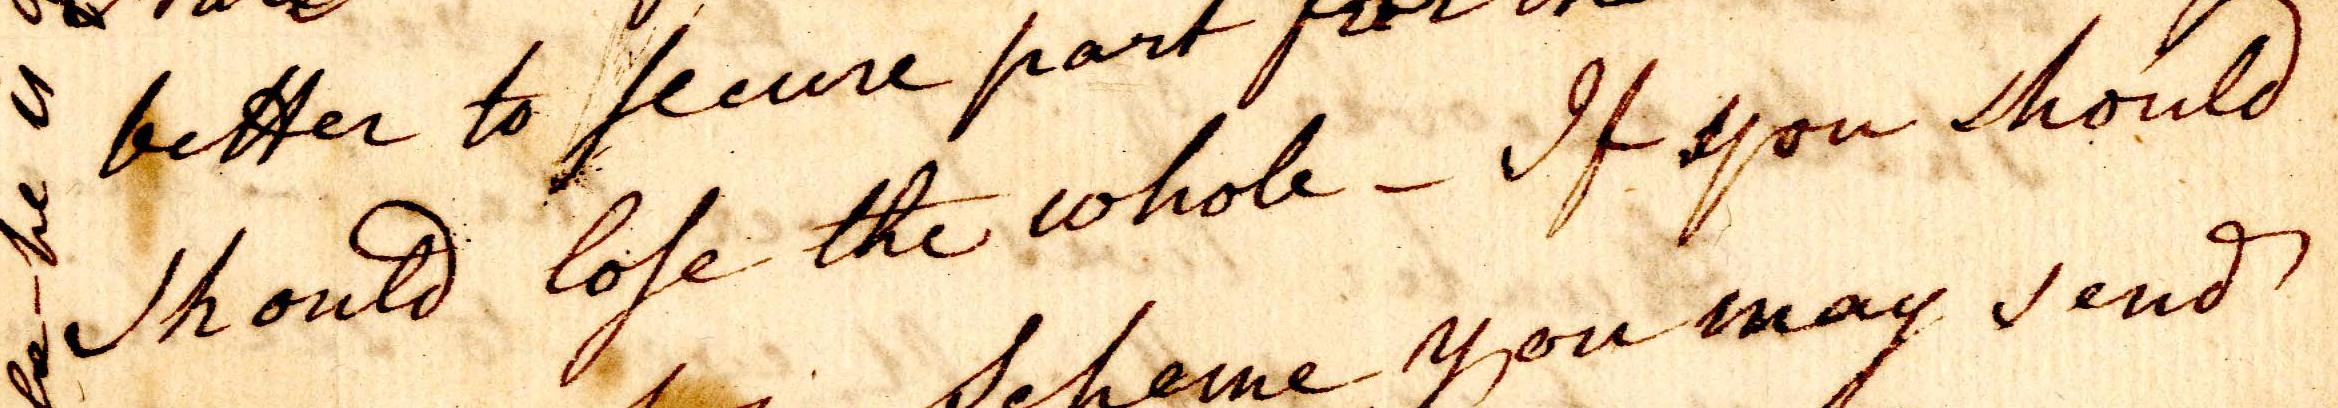should lose the whole- If you should
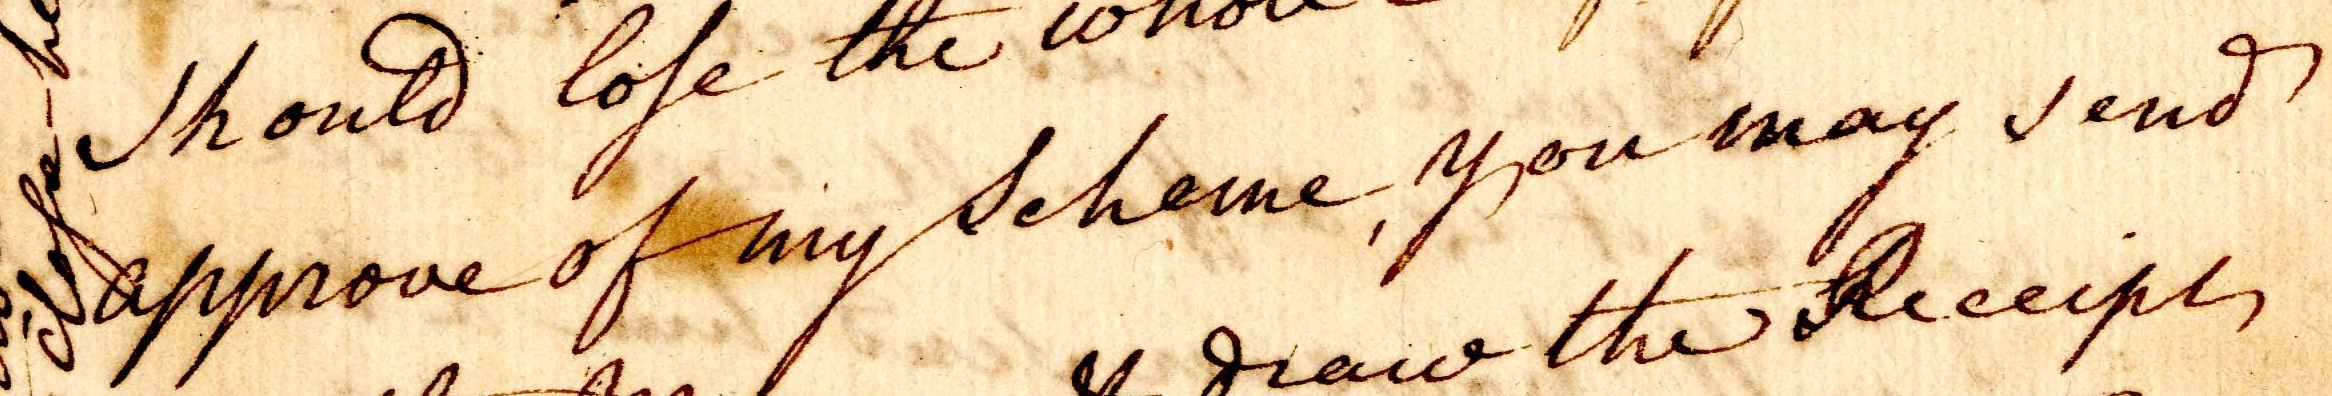approve of my Scheme, you may send
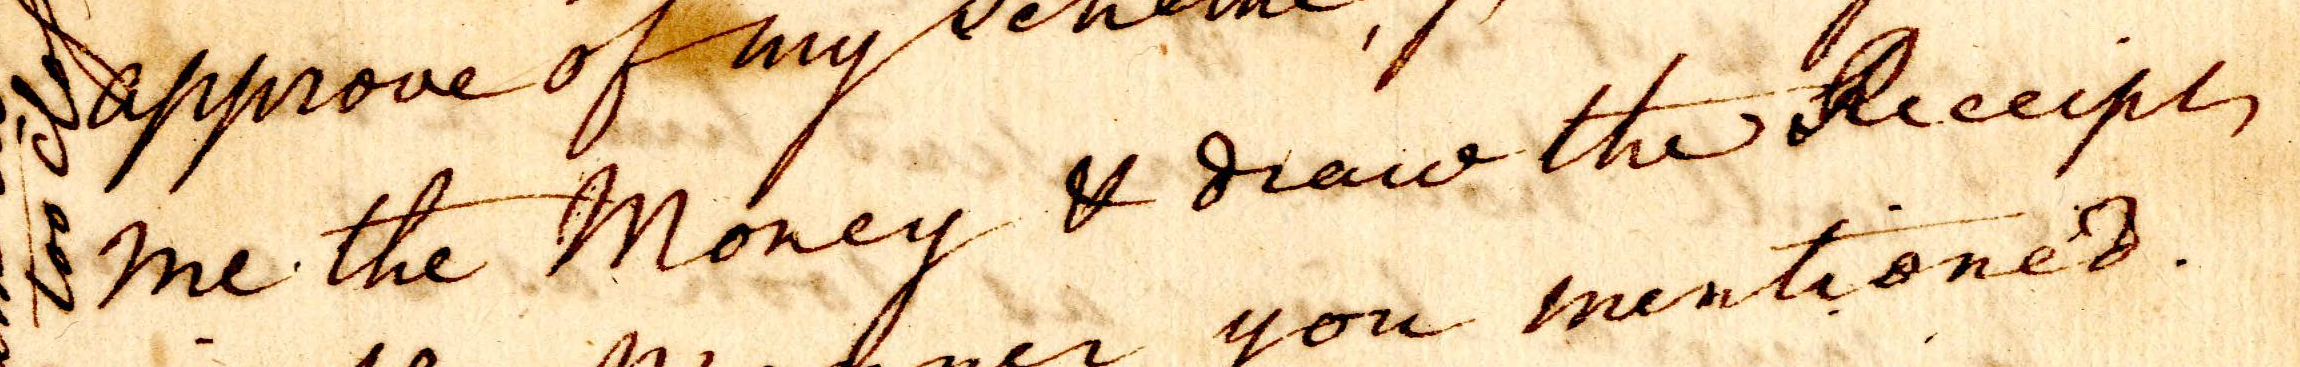me the Money & draw the Receipts
